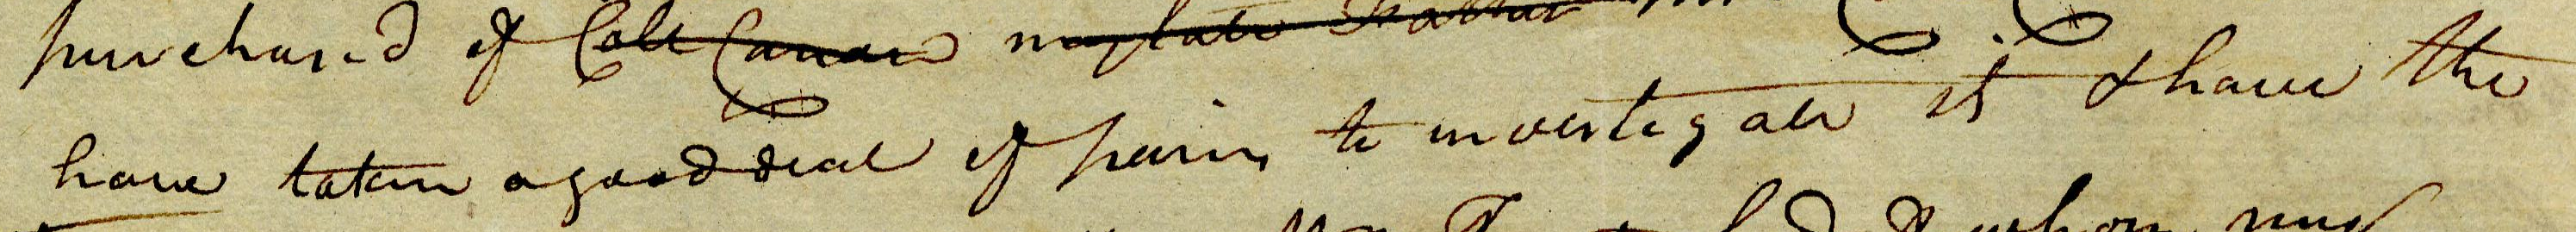have taken a good deal of pairs to investigate it & have the
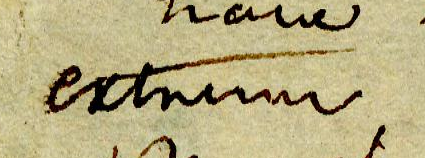extreme
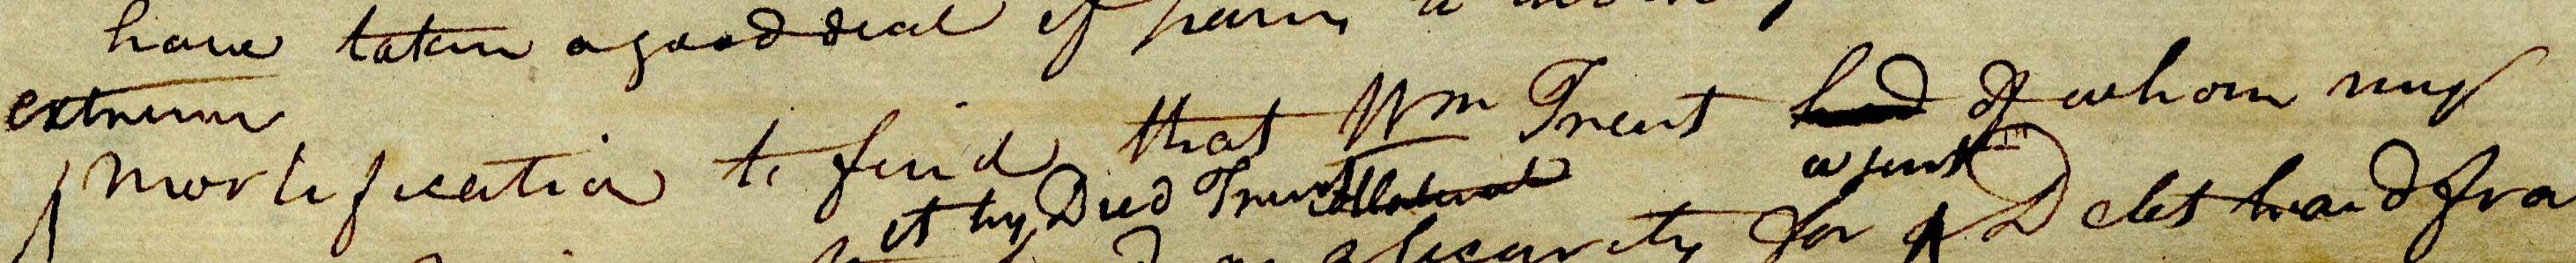^ mortification to find that W^m Trent [had] of whom my
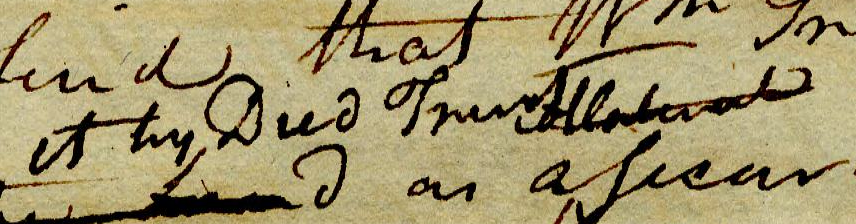it by Died Trent [_______]
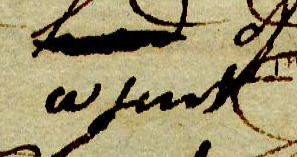a just
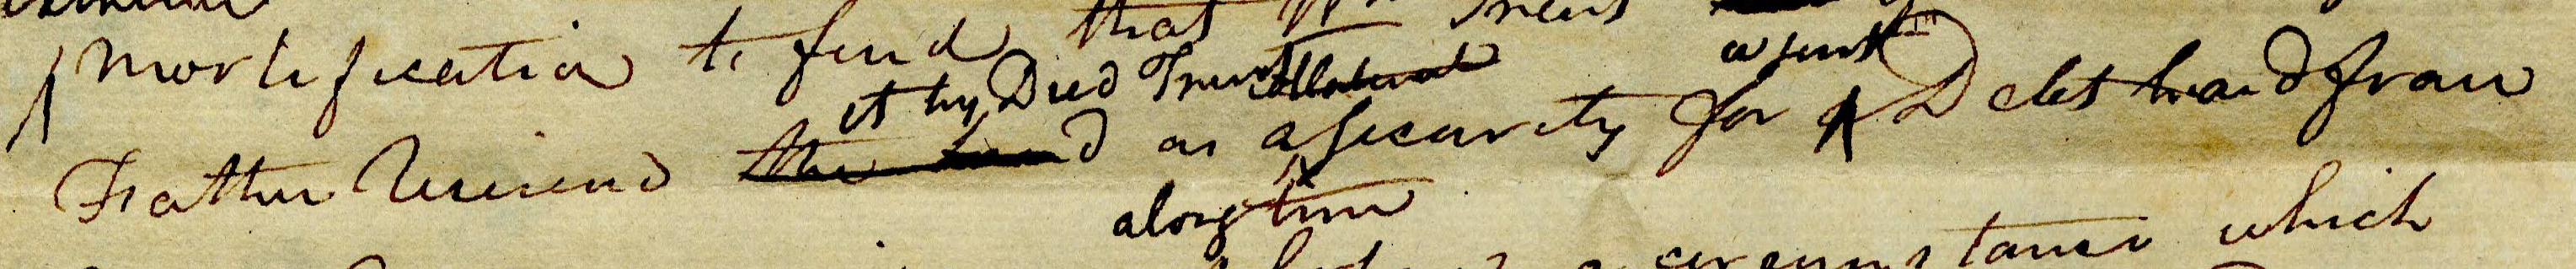Father ruined [the Land] as a security for ^ Debt had frau
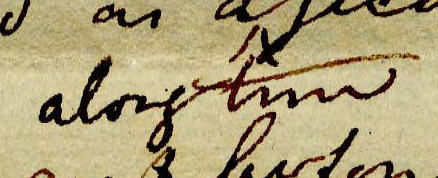along time
